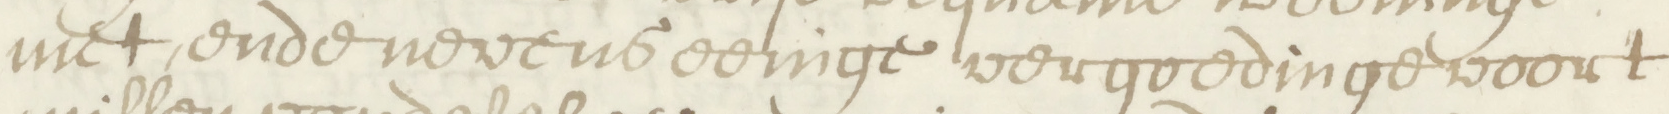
met, ende nevens eenige vergoedinge voor‛t
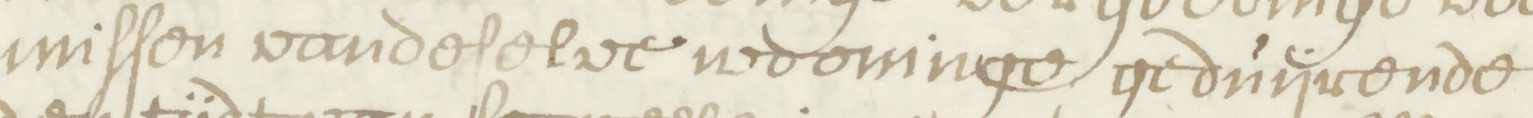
missen van deselve wooninge geduijrende
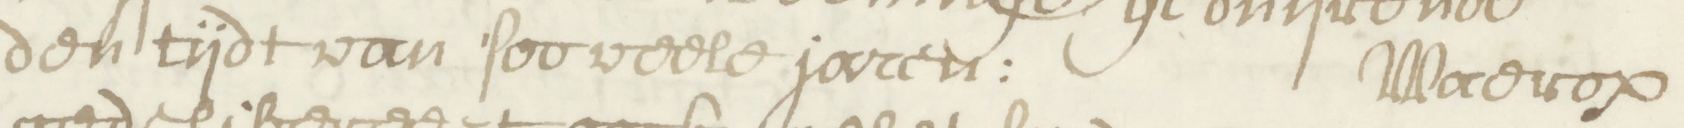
den tijdt van soo veele jaren: Waerop
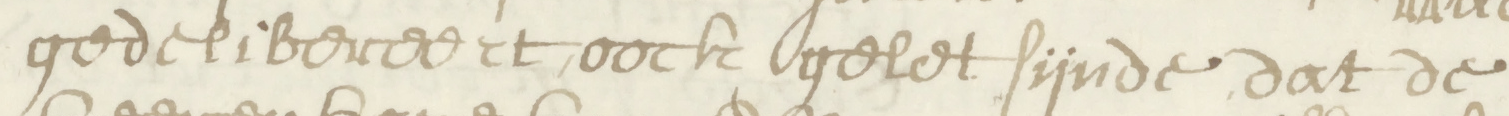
gedelibereert, oock gelet sijnde, dat de
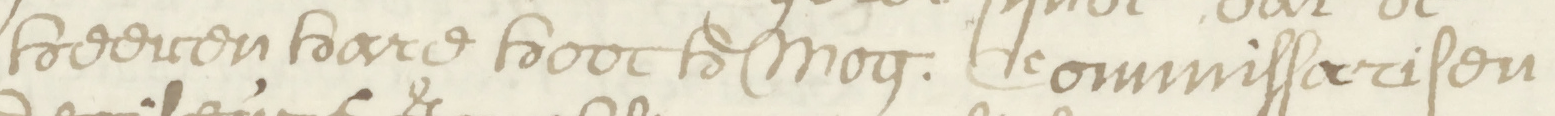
heeren hare hooch Mog: Commissarisen
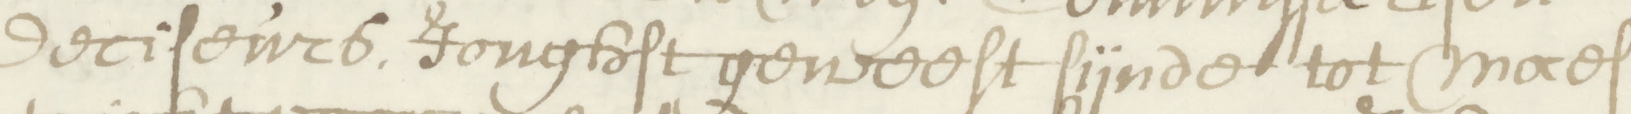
Deciseurs Jonghst geweest sijnde tot Maes
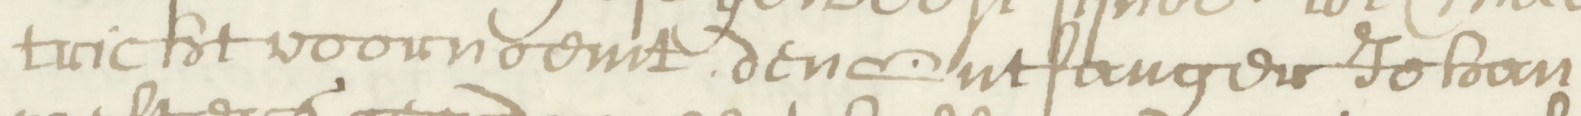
tricht voornoemt den Ontfanger Johan
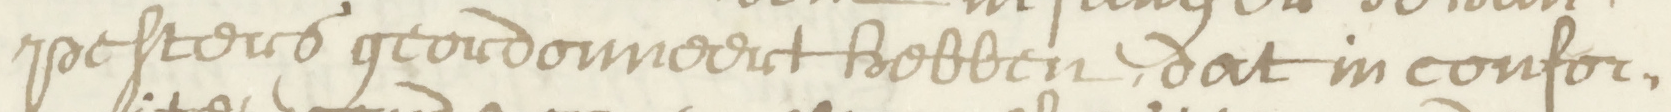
pesters geordonneert hebben, dat in confor,,
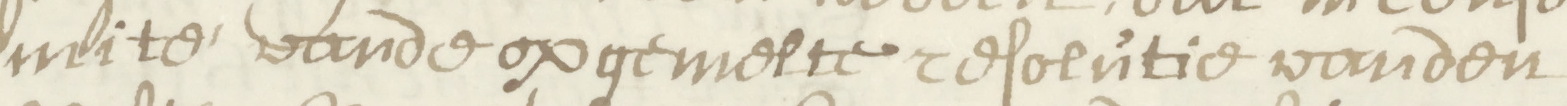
mité vande opgemelte resolutie vanden
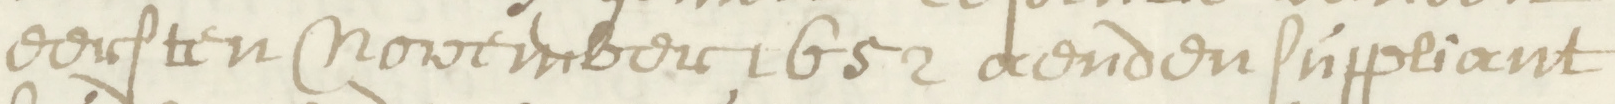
eersten November 1652 aenden suppliant
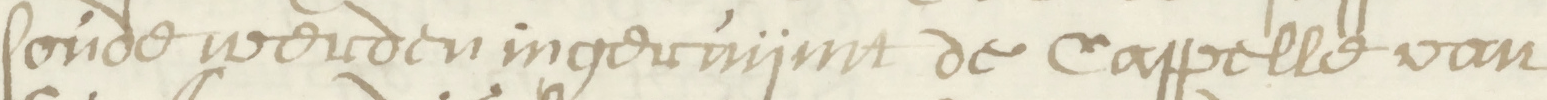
soude werden ingeruijmt de Capelle van
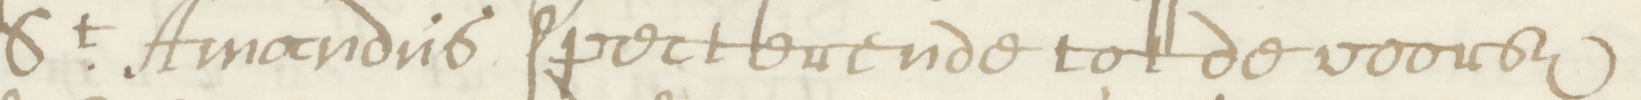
St. Amandus specterende tot de voors
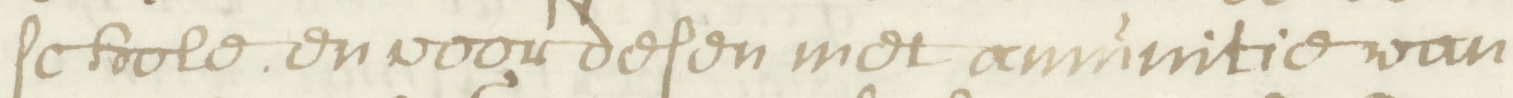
schole, en voor desen met amunitie van
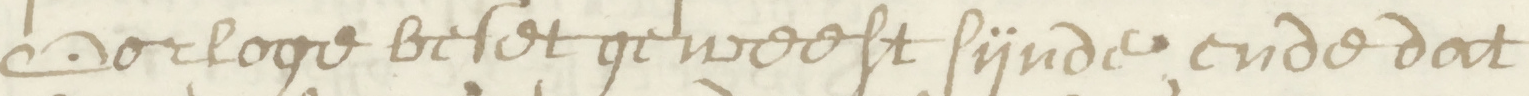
Oorloge beset geweest sijnde, ende dat
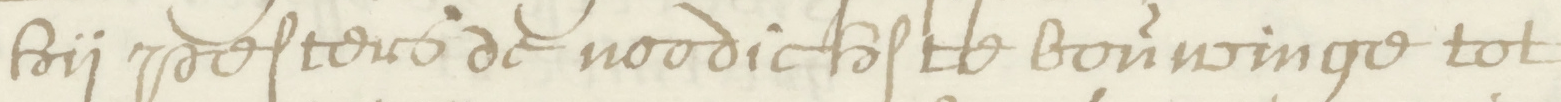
hij pesters de noodichste bouwinge tot
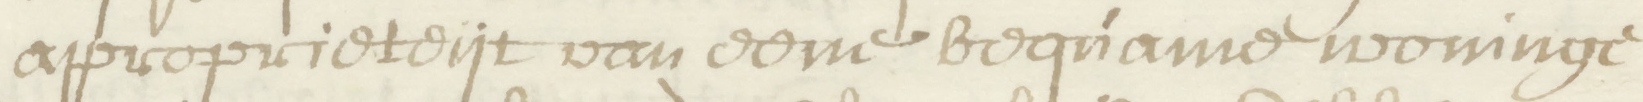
approprieteijt van eene bequame woninge
